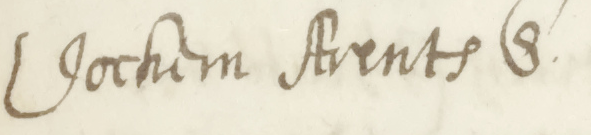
Jochem Aerentsz.
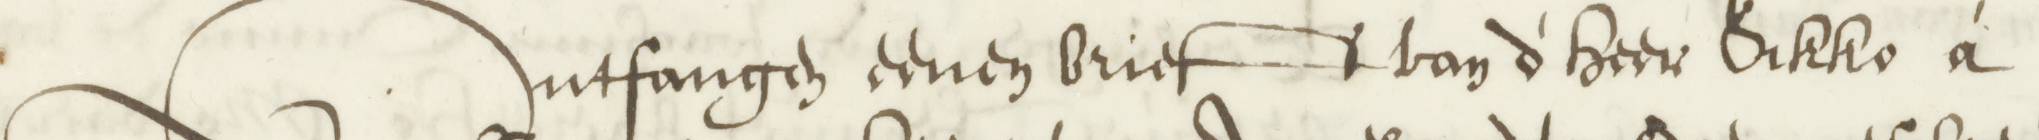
Ontfangen eenen brieff van d'heer Sikke á
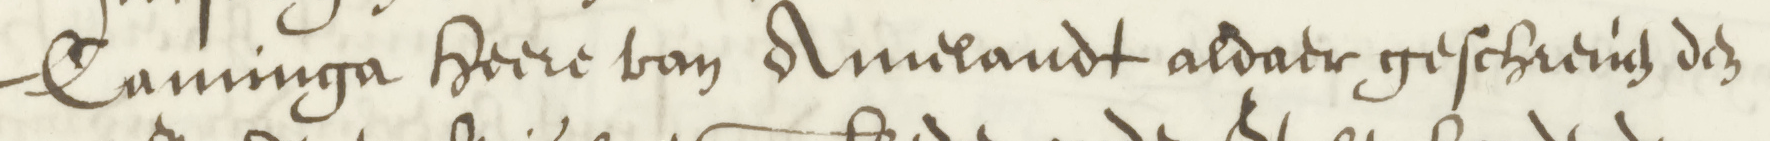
Caminga heere van Amelandt aldaer geschreuen den
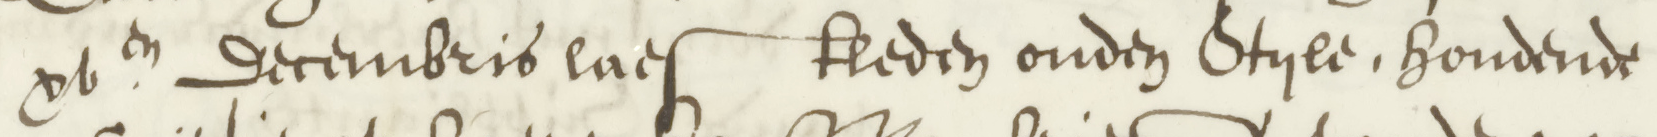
xven Decembris laestleden ouden Style, houdende
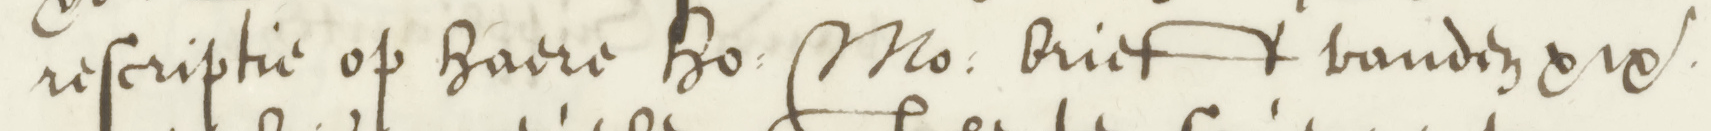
rescriptie op haere Ho:Mo: brieff vanden xix.
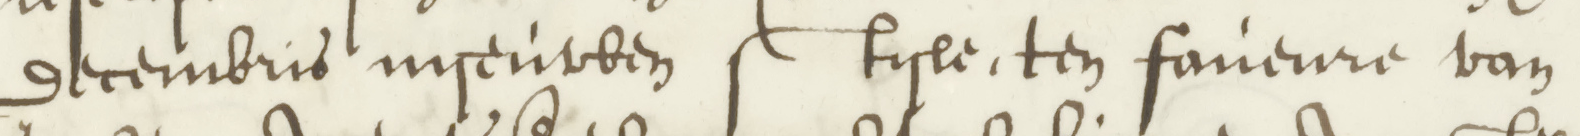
Decembris nyeuwen style ten faueure van
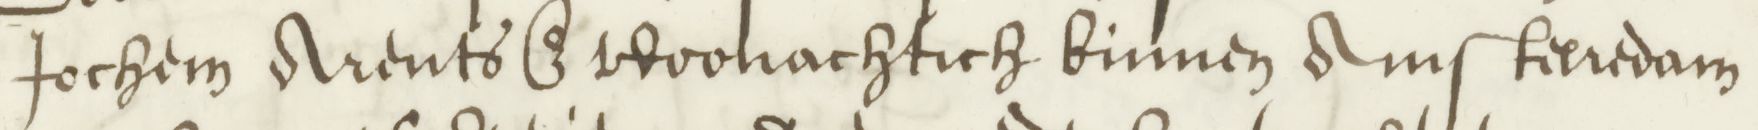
Jochem Arentsz woonachtich binnen Amstelredam
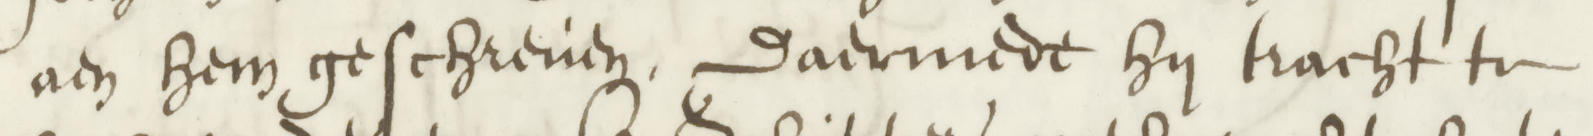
aen hem geschreuen, Daermede hy tracht te
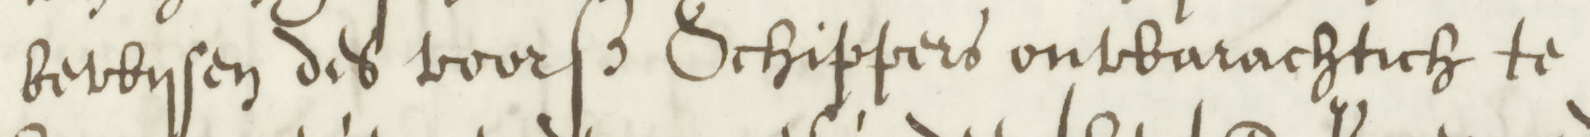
bewysen des voors Schippers onwarachtich te
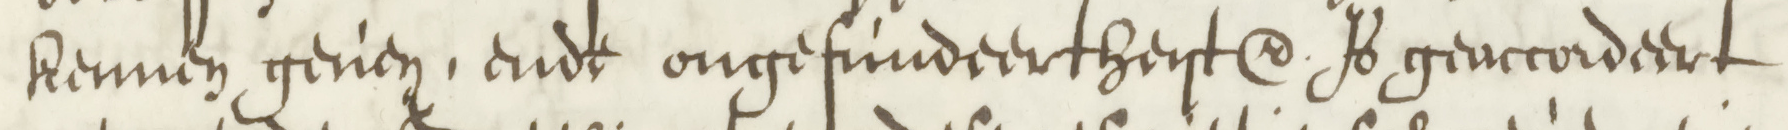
kennen geuen ende ongefundeertheyt E. Is geaccordeert
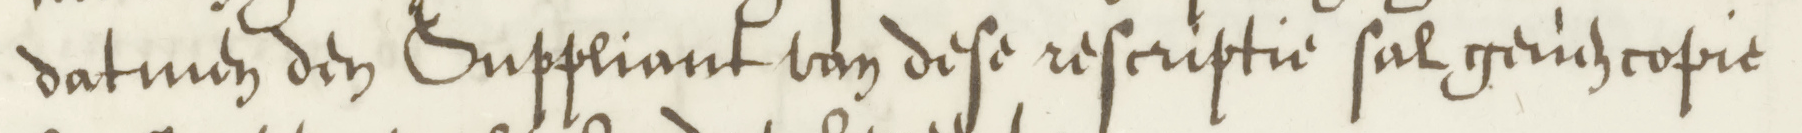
datmen den Suppliant van dese rescriptie sal geuen copie
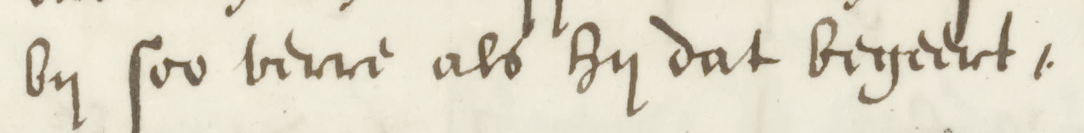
bij soo verre als hy dat begeert.
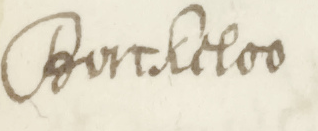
Borckeloo
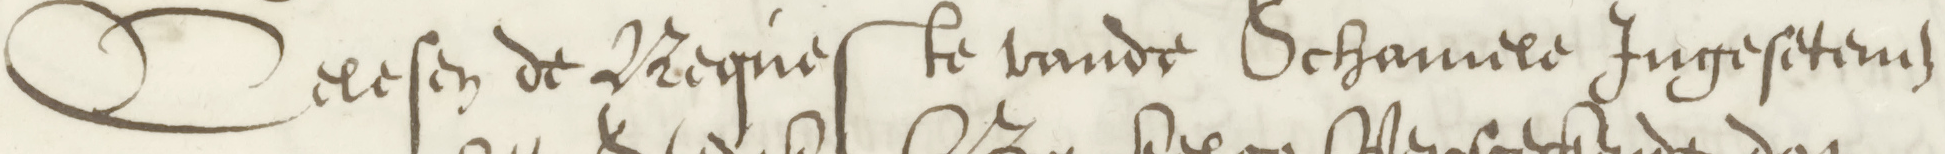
Gelesen de Requeste vande Schamele Ingeseten
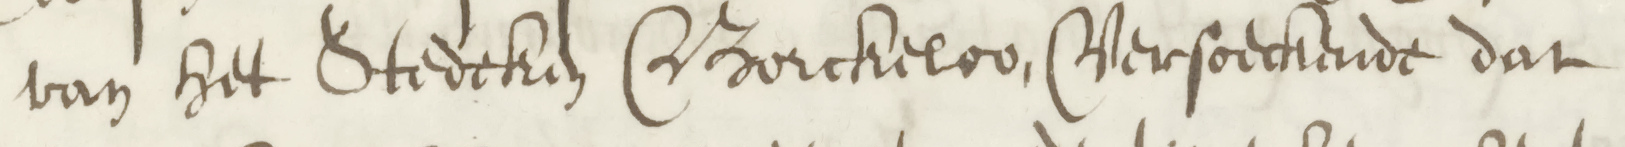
van het Stedeken Borckeloo. Versoeckende dat
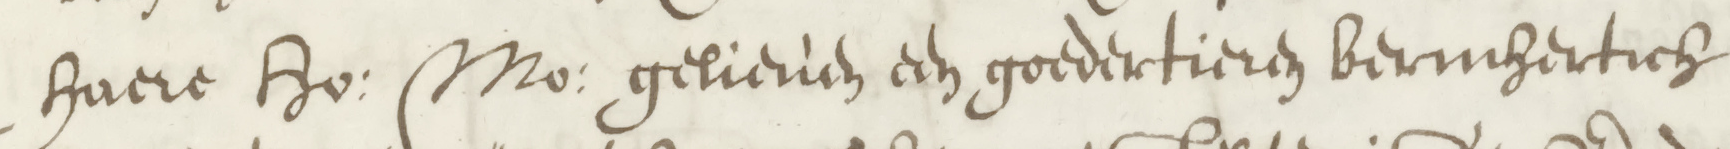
haere Ho:Mo: gelieuen een goedertieren bermhertich
